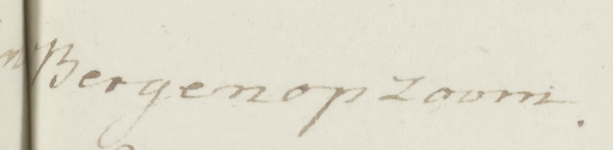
Bergen op Zoom
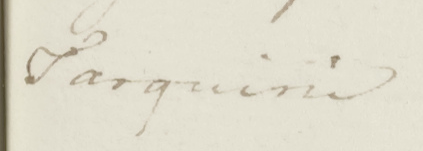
Tarquini
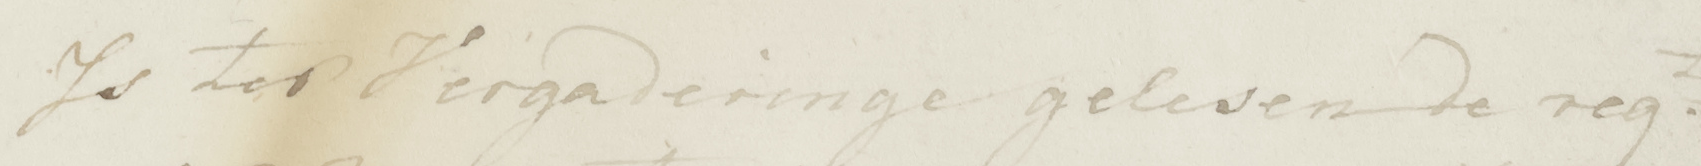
Is ter Vergaderinge gelesen de reqte.
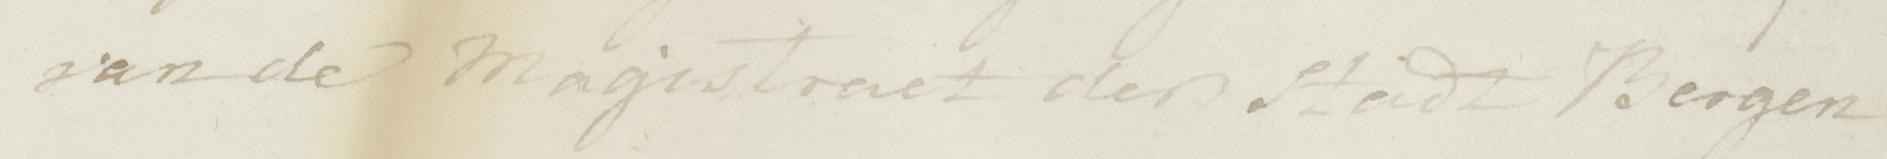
van de Magistraet der Stadt Bergen
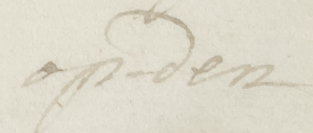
op den
